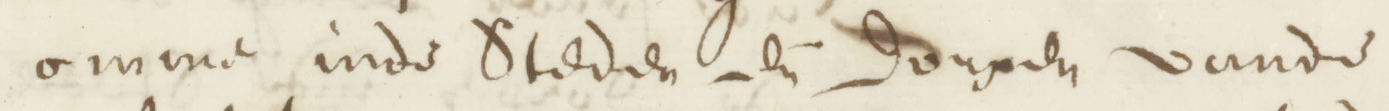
omme inde Steden en Dorpen vande
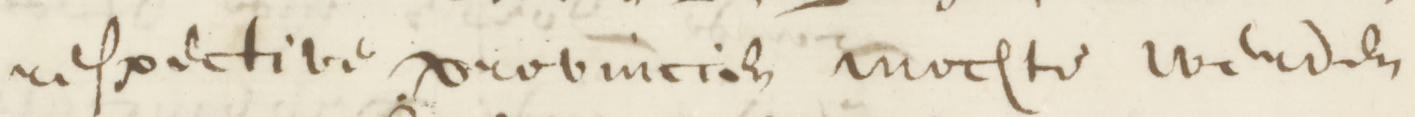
respective provincien mochte werden
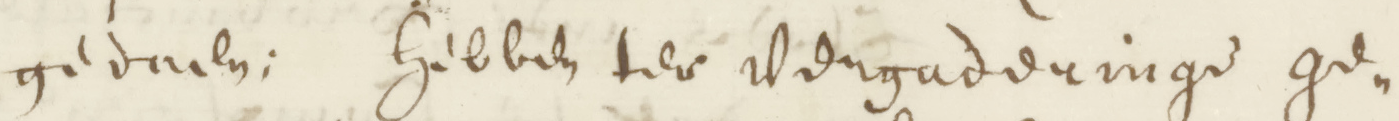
gedaen; hebben ter Vergaderinge ge„
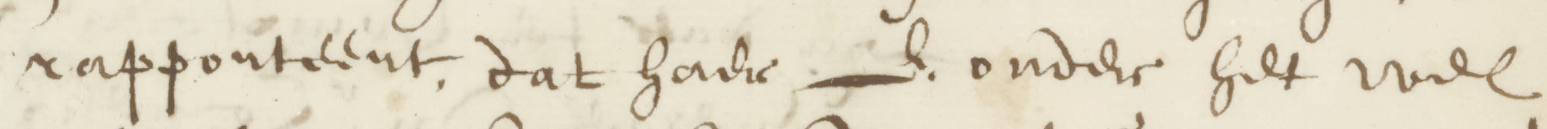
rapporteert, dat haer E. onder het wel
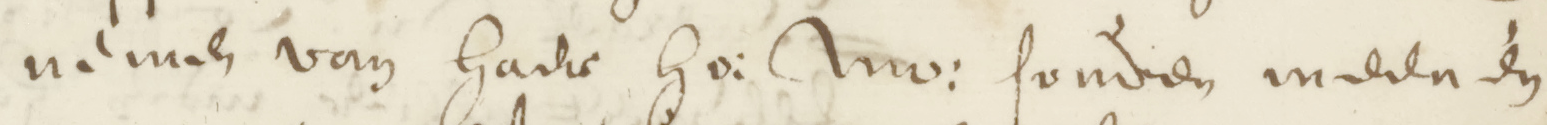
nemen van haer ho:Mo: souden meenen,
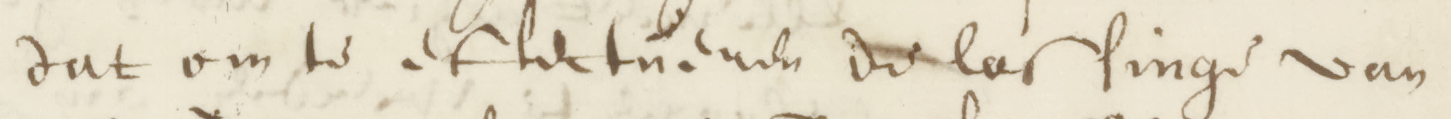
dat om te effectueren de lossinge van
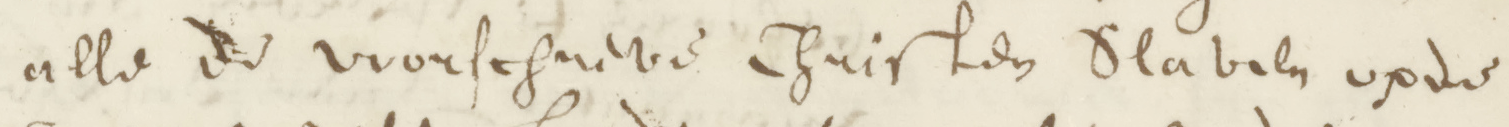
alle de voorschreve Christen Slaven opde
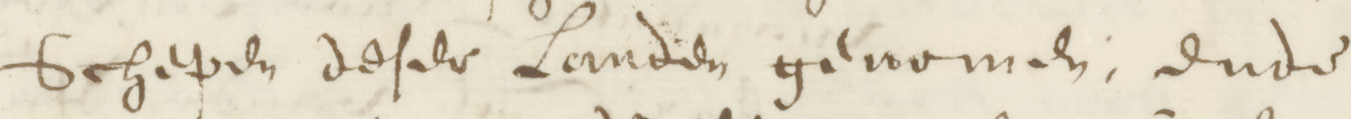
schepen deser Landen genomen; ende
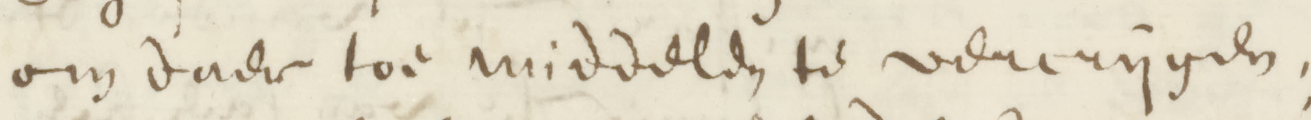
om daer toe middelen te vercrijgen,
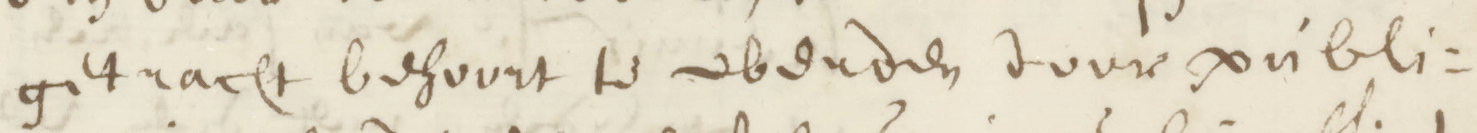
getracht behoort te werden door publi=
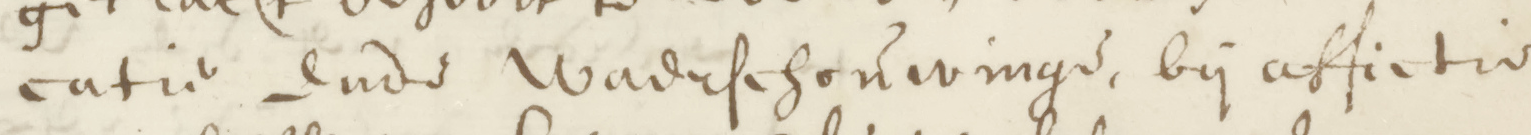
catie ende waerschouwinge, bij affictie
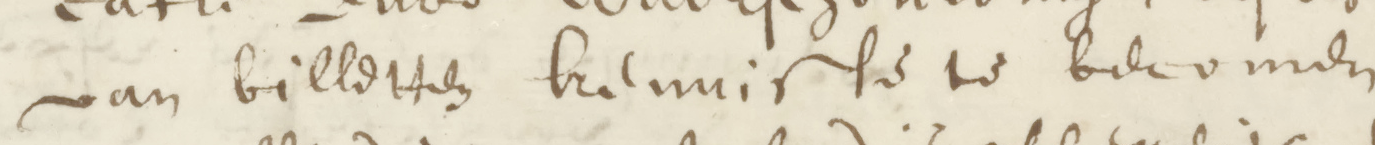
van billetten kennisse te becomen
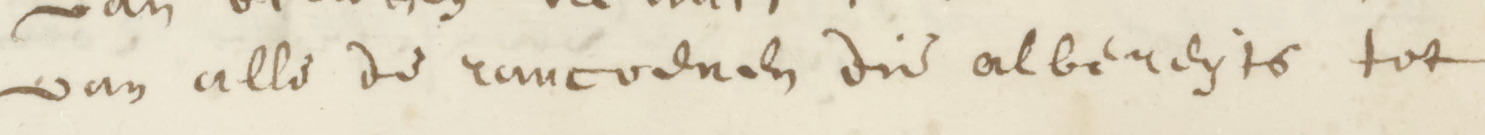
van alle de rancoenen die albereijts tot
